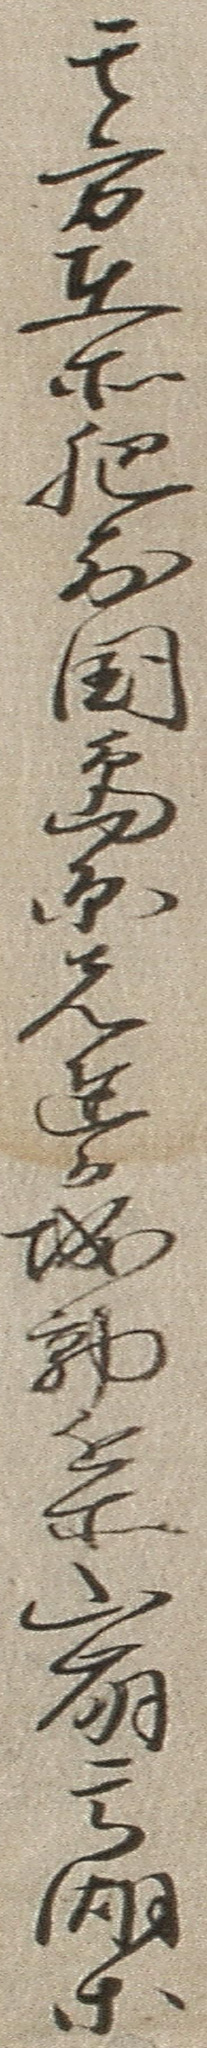其方在所肥前国島原先達而城郭近所山崩高潮等
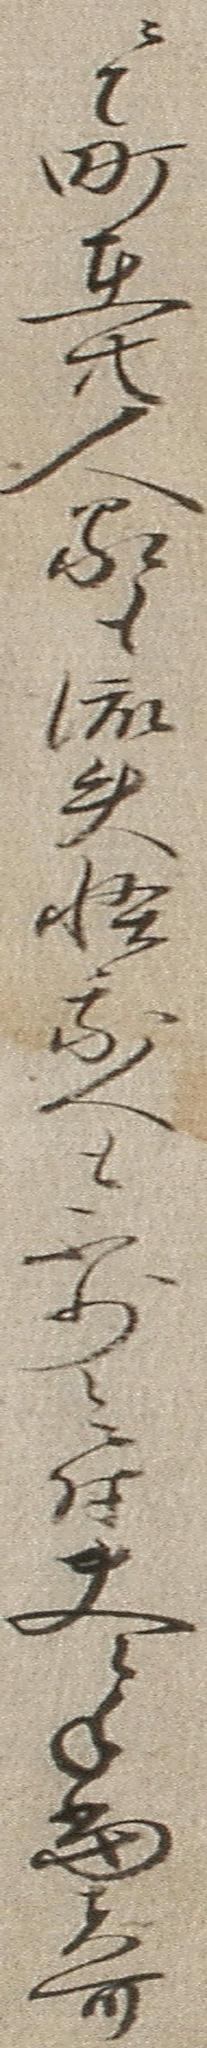にて町在共人家も流失怪我人も不少候に付夫々手当者可
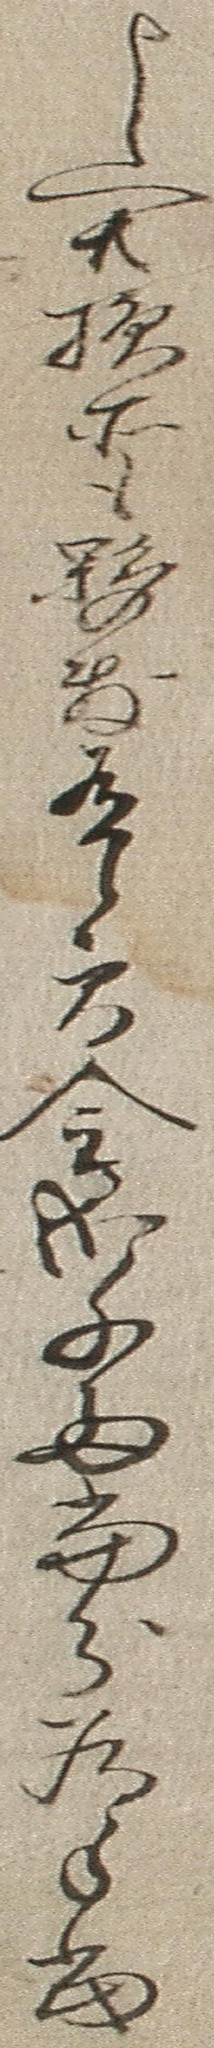申候へ共損所も夥敷有之候間金弐千両当分為手当
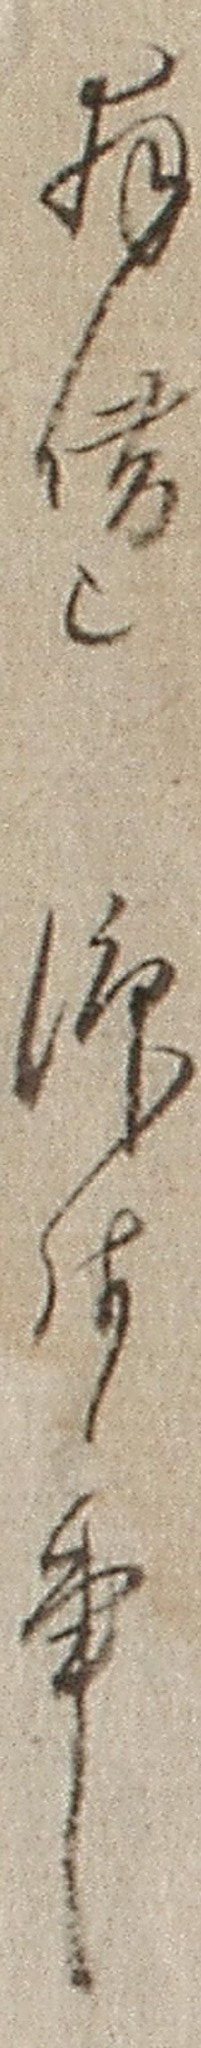拝借被仰付候事
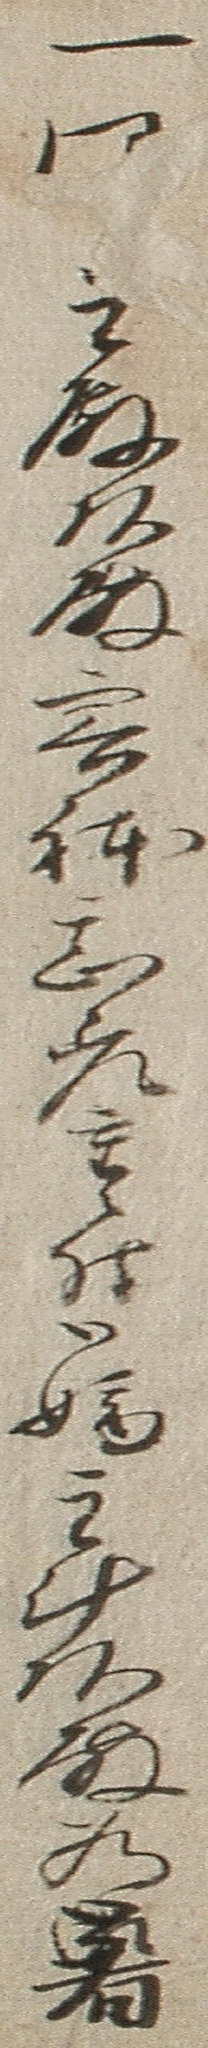一同主殿頭殿容体甚差重候付御嫡主計頭殿為看
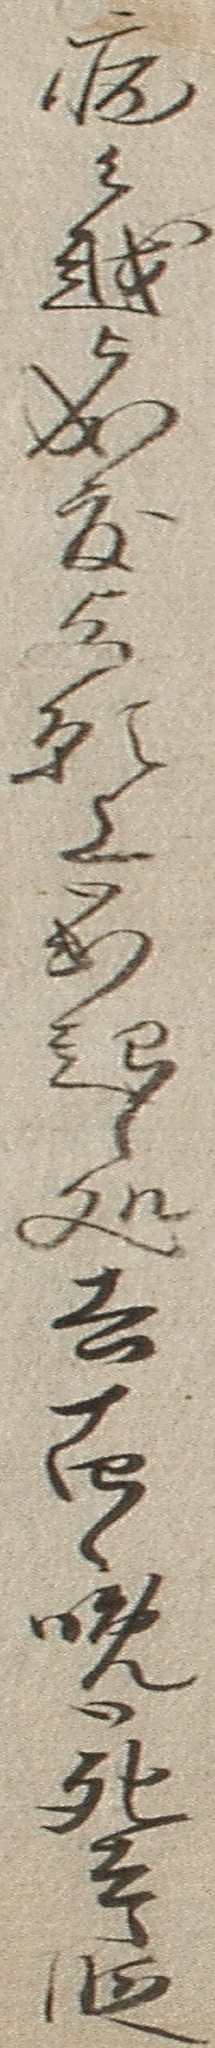病御越被成度旨願上御出起候処去十四日晩御死去候段

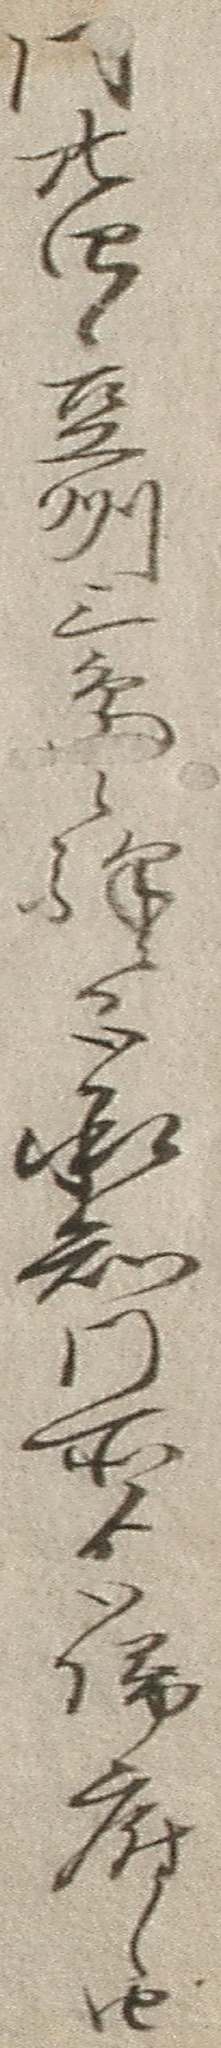同廿四日豆州三島之駅ニ而御承知同所ゟ御帰府候由
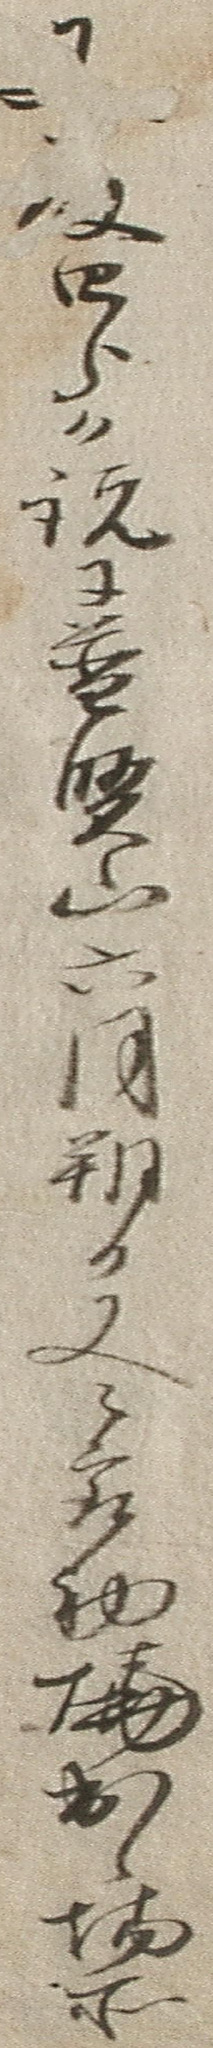又藤四郎か説に普賢山六月朔日又々最初焼出候場所
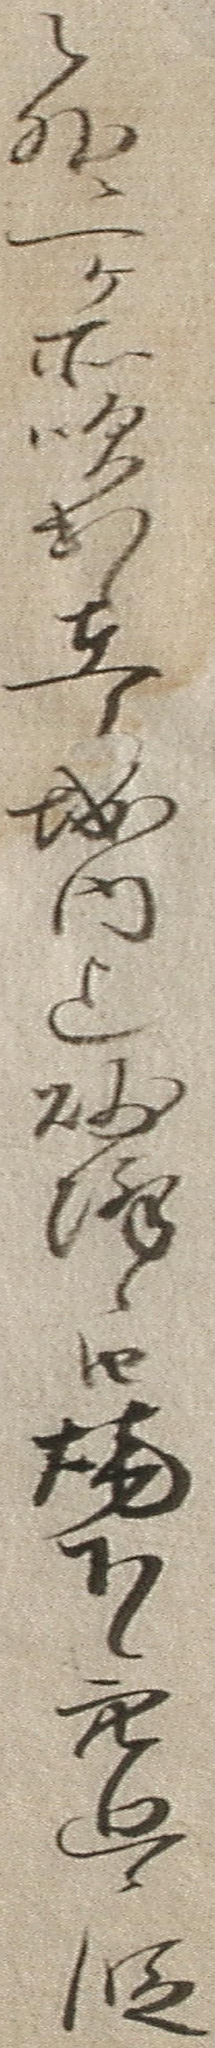之外に一ケ所吹出し在之城内迄砂降候由焼下候穴廻に段
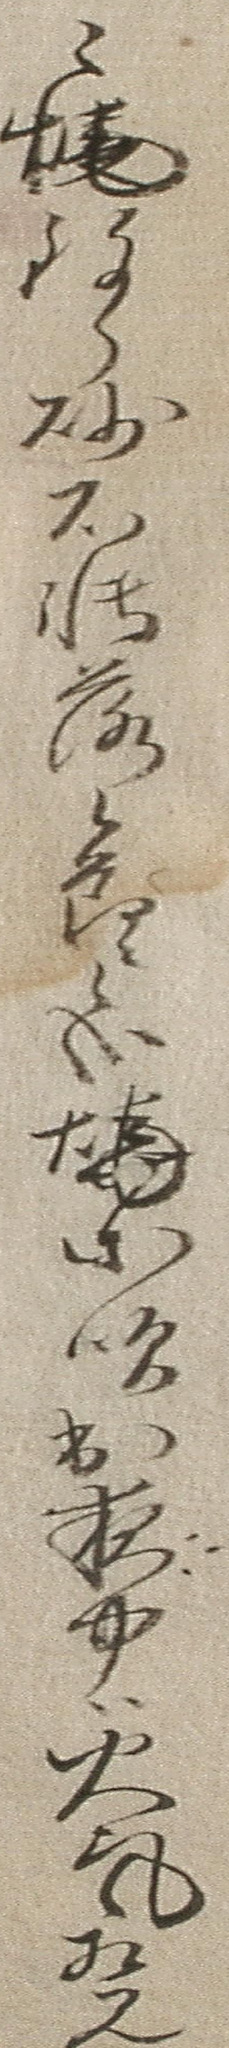々焼致候砂石転落之節に候哉焼等吹出夜中は火気相見へ
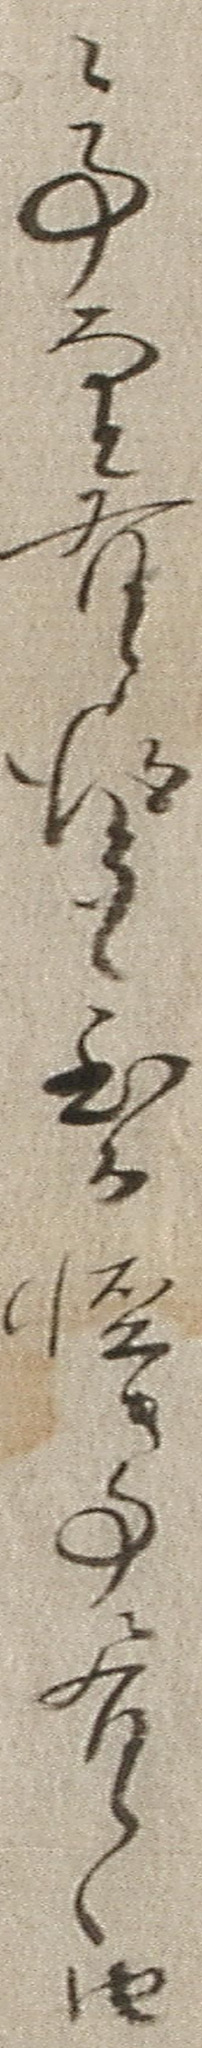候事なと有之候得とも至而軽き事に有之候由
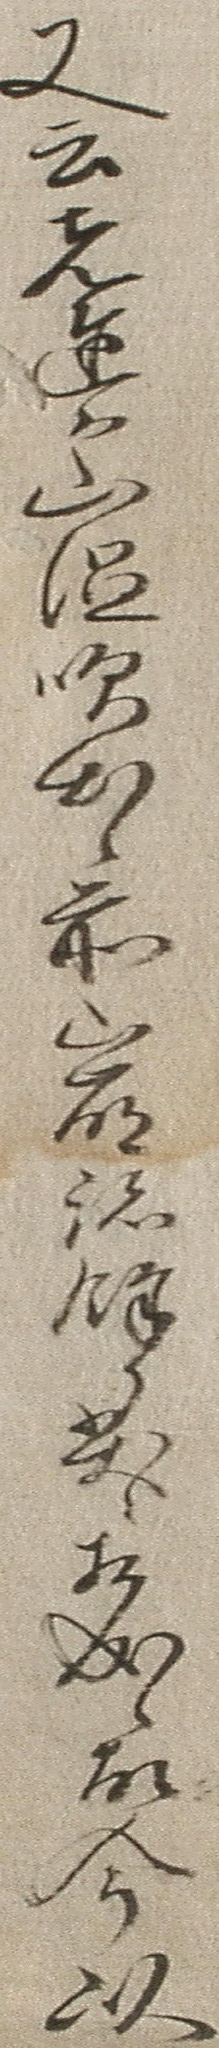又云先達而山温吹出候前山崩跡余り尖々相成候故今以
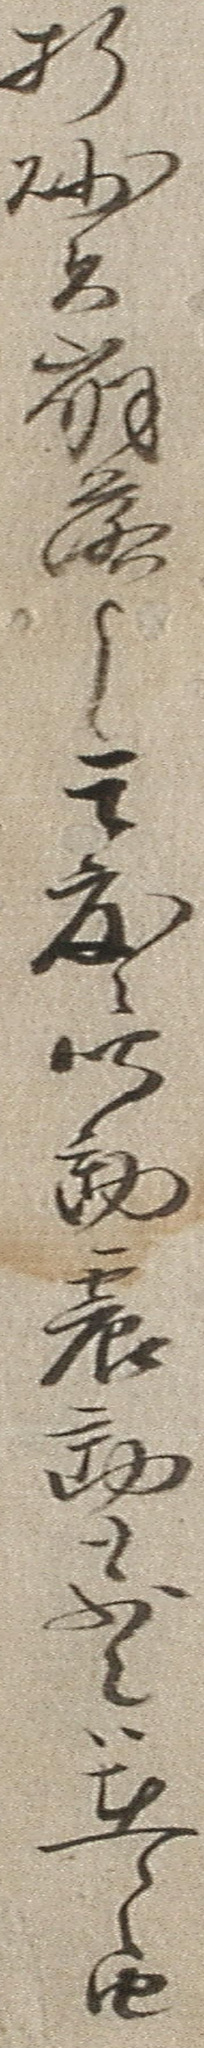折砂石崩落申候今度之鳴動震動も少しは在之候由
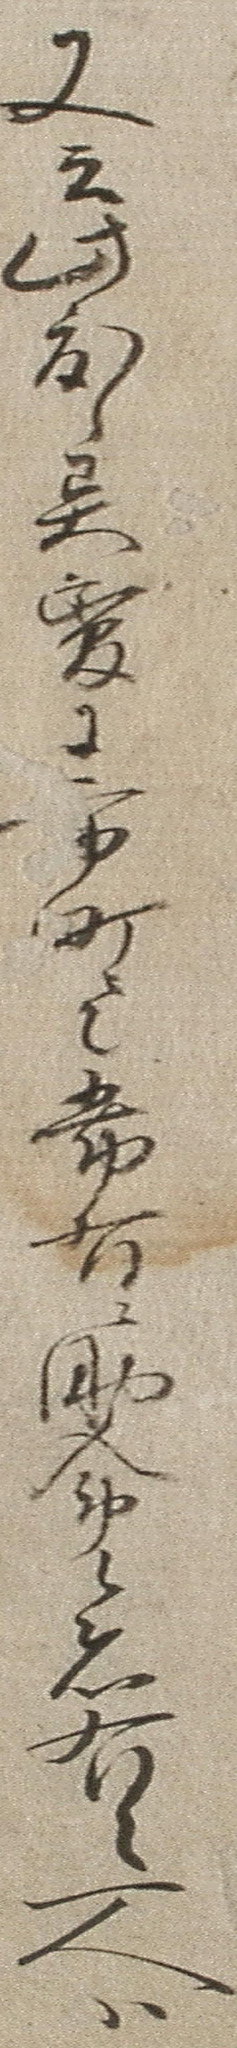又云此度之異変に市町にて希有に助命之者有之一人は
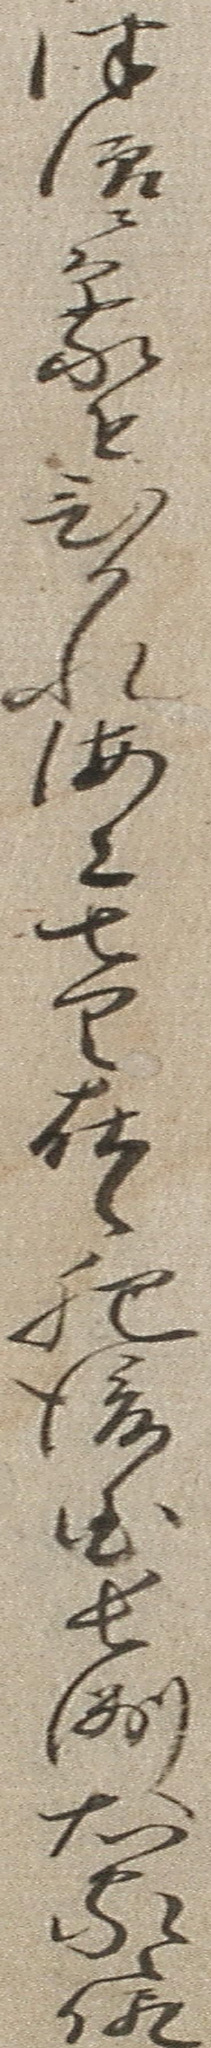津浪ニ而家をひかれ海上七里在之肥後国長洲へ右家之侭
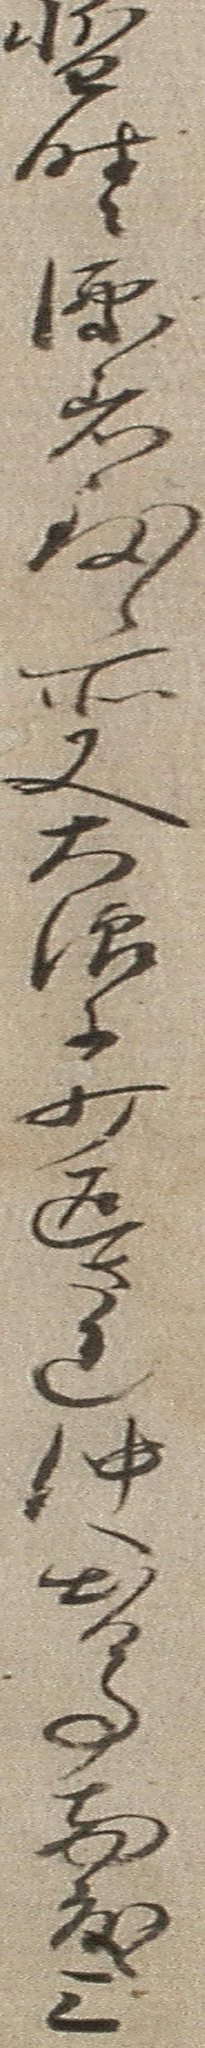暫時に漂着致候所又大浪に打返され沖へ出る事両度三
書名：太平秘録抜書　浅間山燒及普賢山崩
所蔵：東京大学地震研究所図書室 Earthquake Research Institute Library, The University of Tokyo, JAPAN
